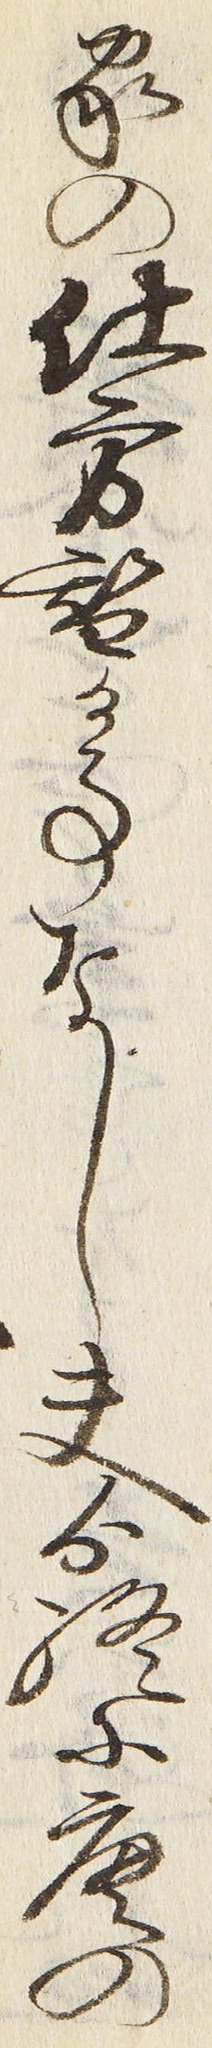家の仕方替る事なし夫ゟ終に唐の
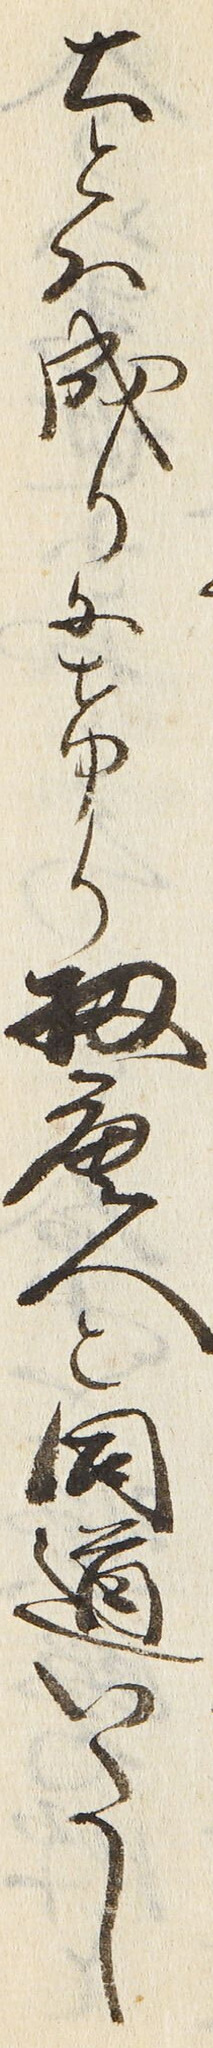土とは成りにけり扨唐人と同道いたし
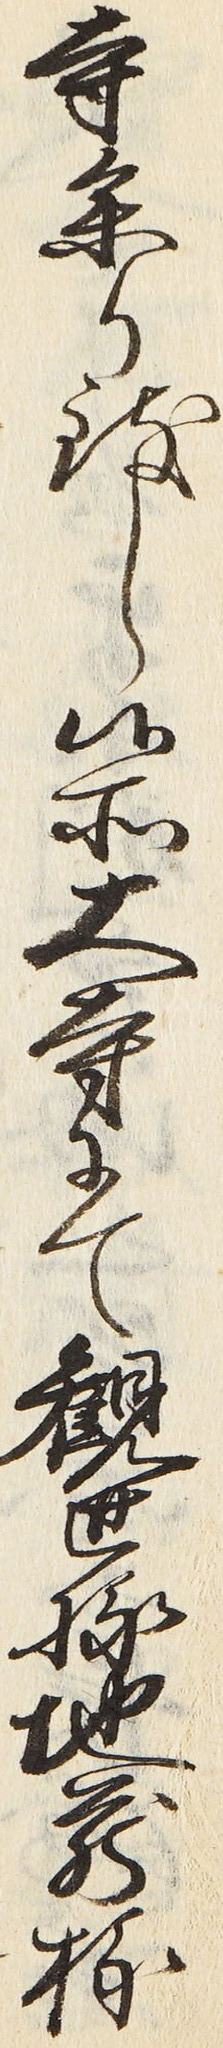寺参り致し候所大寺にて観世様地蔵様
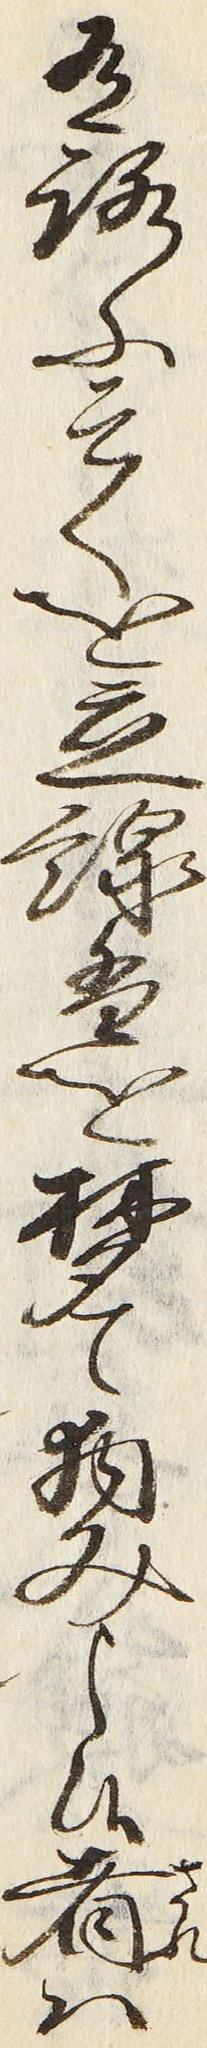有ろふそくを立線香を焚て拝み申候者は
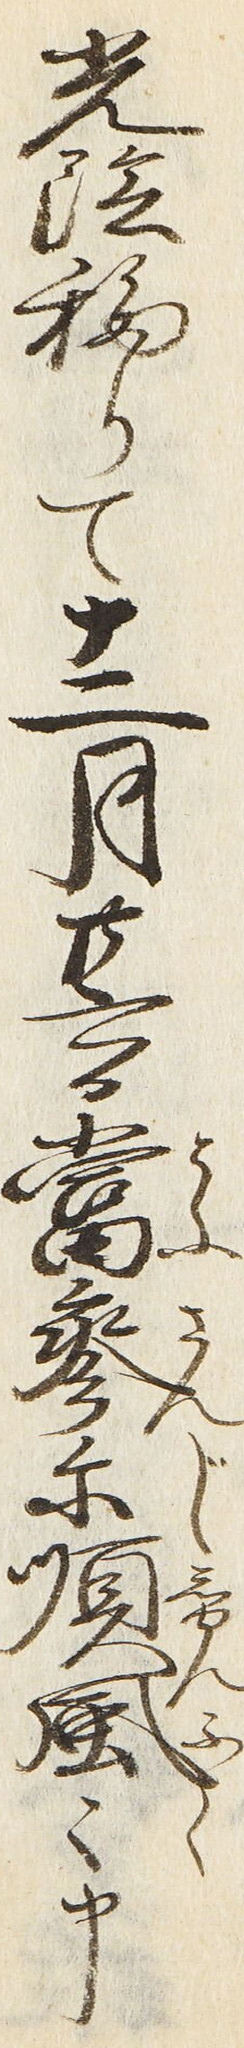光陰移りて十二月廿六日當參尓順風々申
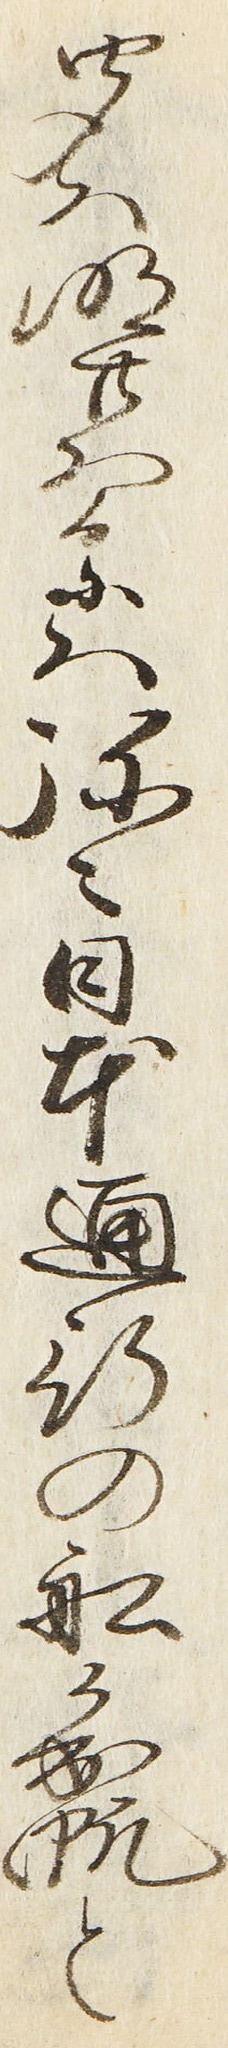聞は明廿八日には弥々日本通行の船か出帆と
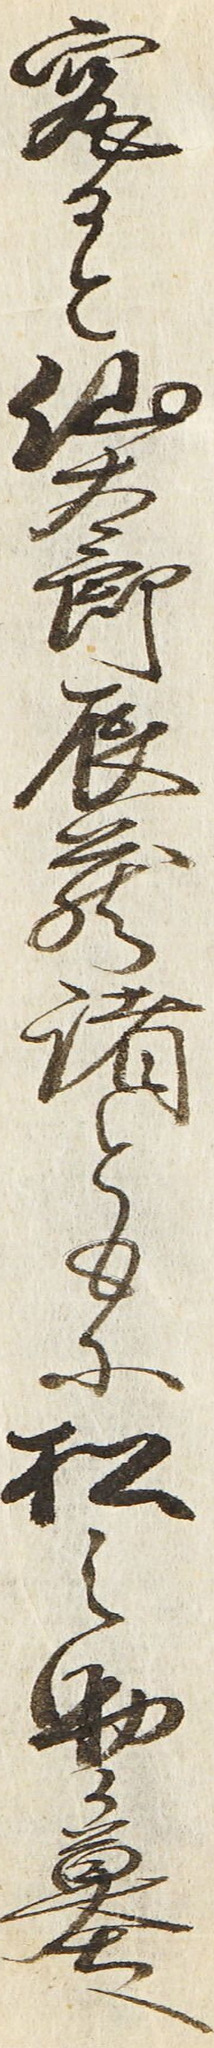究ると仙太郎辰蔵諸ともに松之助か墓へ
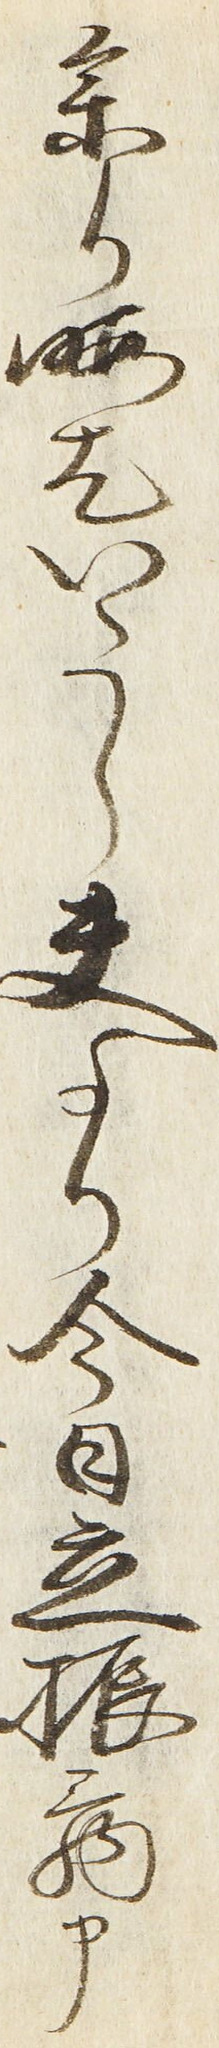参り暇乞いたし夫より今日立振舞申
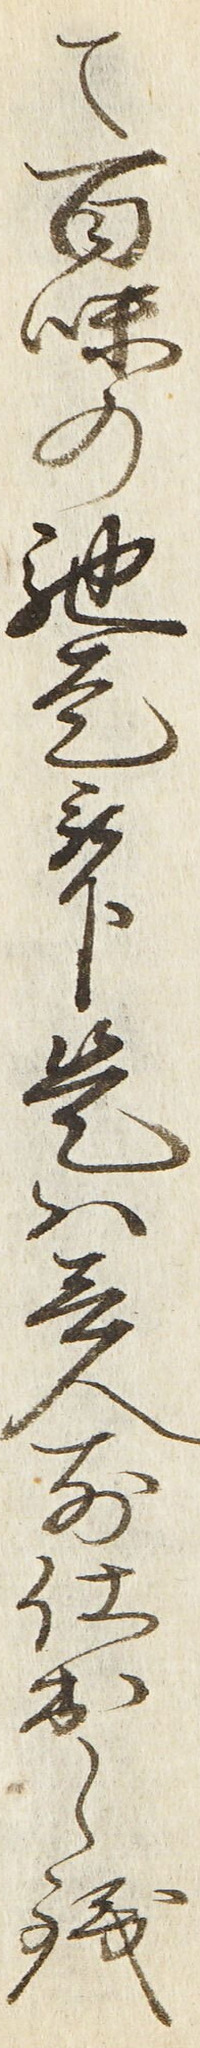て百味の馳走被下是は壱人前仕出し銭
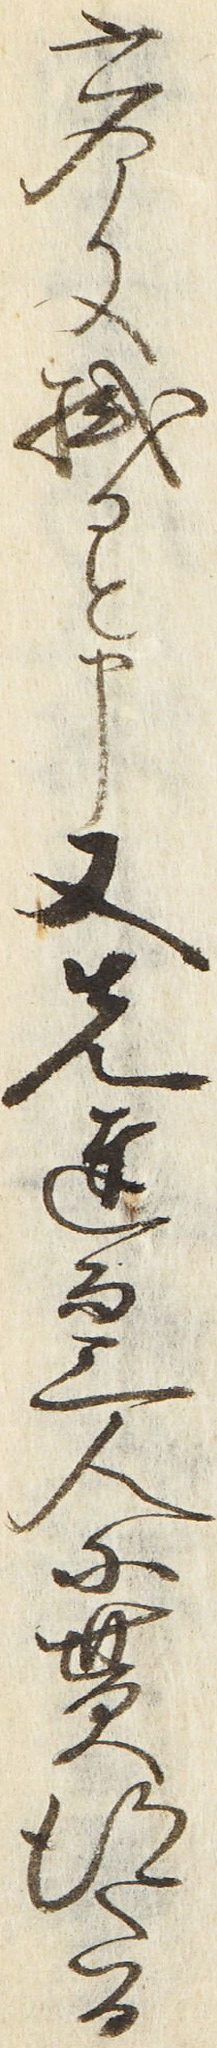六貫文掛ると申又先達て三人に貰得たる

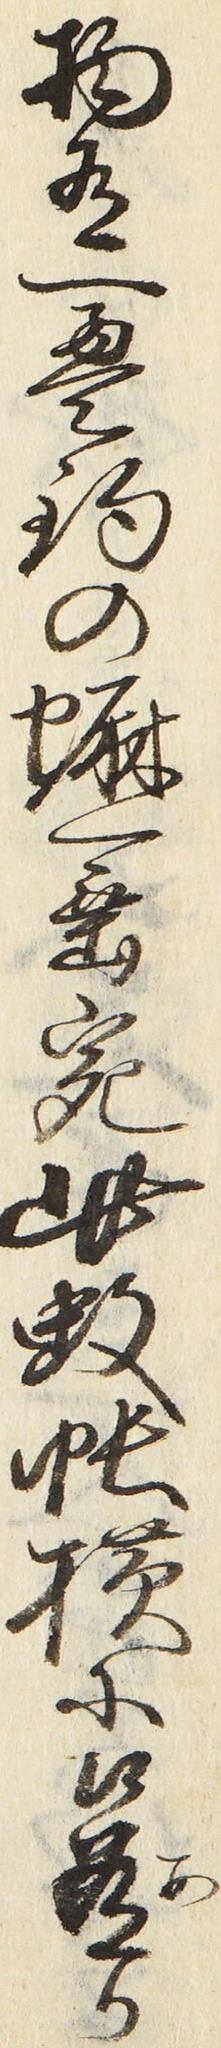物有一畳釣の帷一垂宛此蚊帳横に口有り
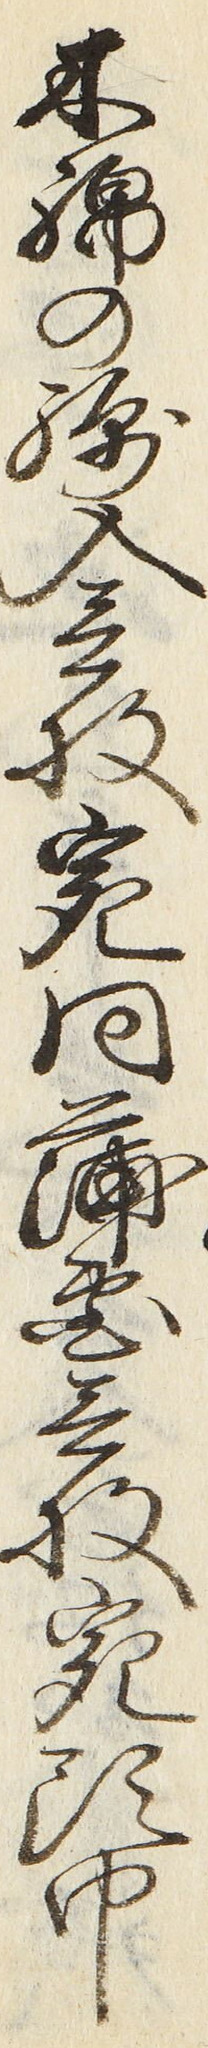木綿の綿入壱枚宛同蒲団壱枚宛頭巾
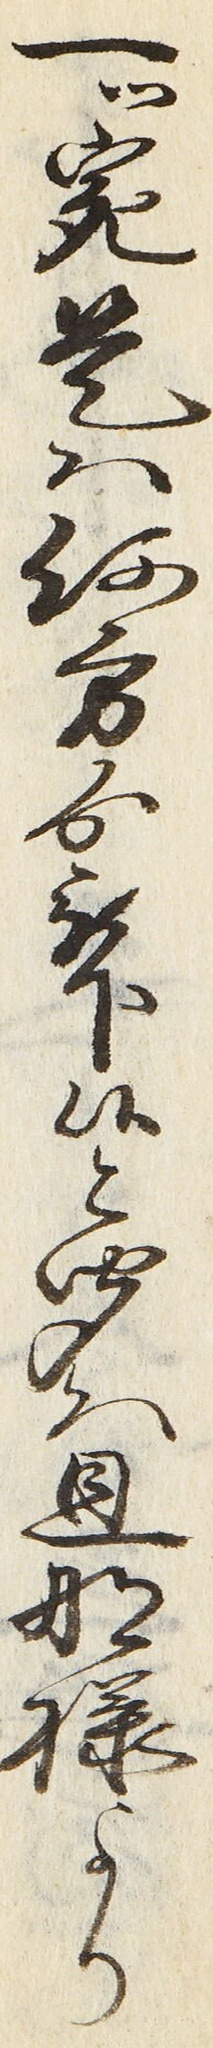一ッ宛是ハ何方ゟ被下候と聞ハ旦那様より
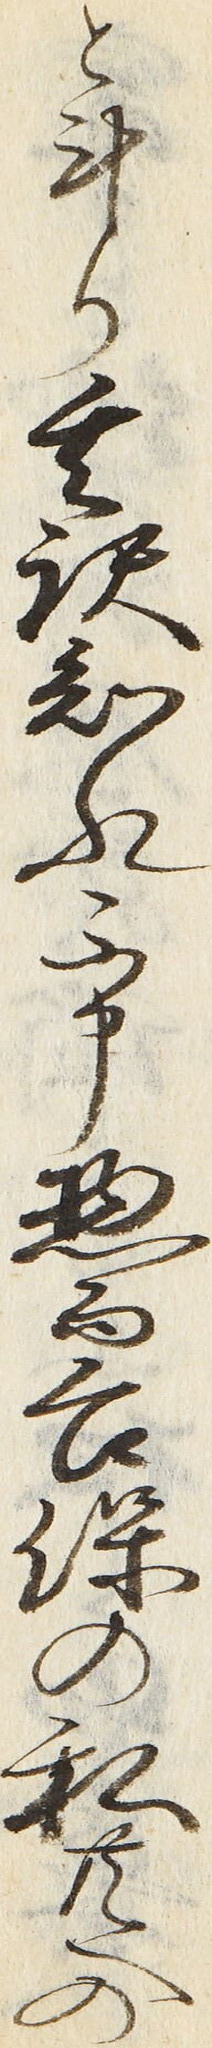と計り其訳知れ不申惣而台保の私共への
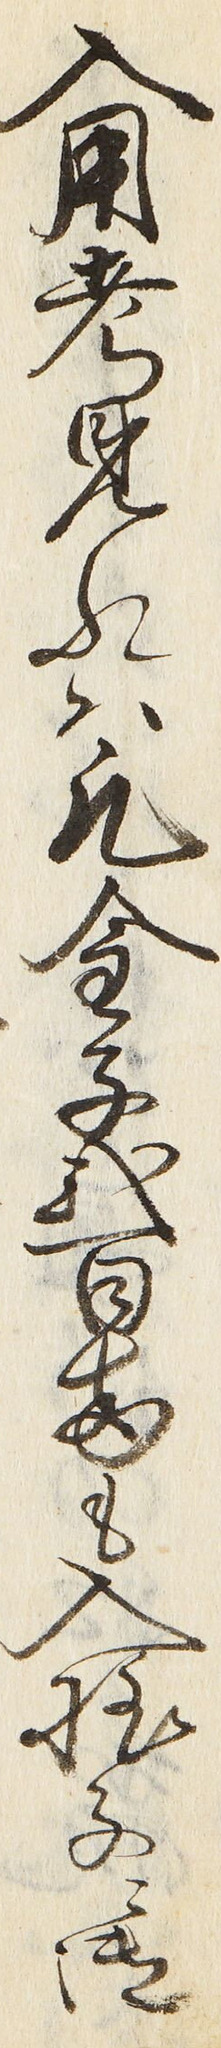入用考見れハ凡金子弐百両も入様子ニ御
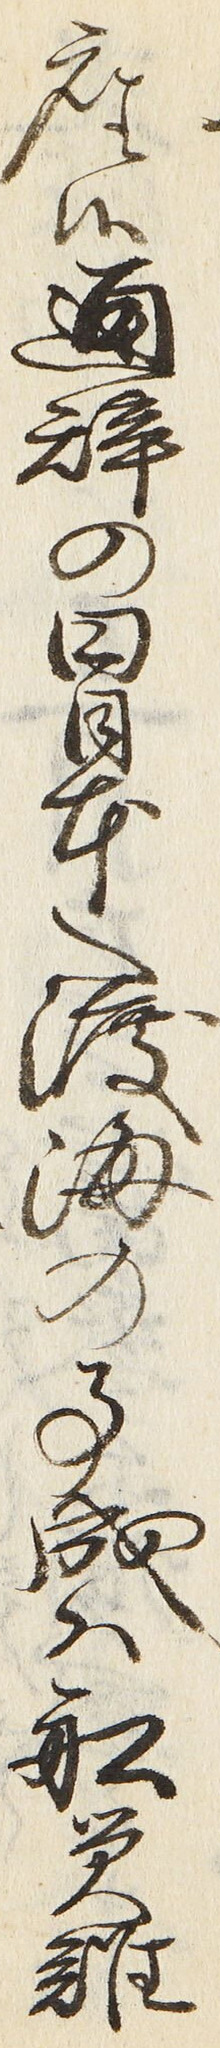座候通辞の四日日本へ渡海の事成ハ船覚難
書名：天保漂流記
